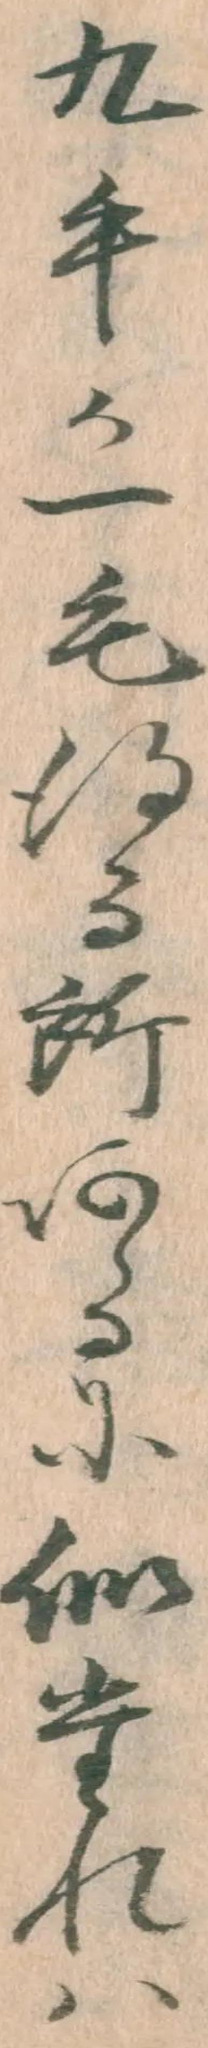九牛か一毛得る所あるに似たれは
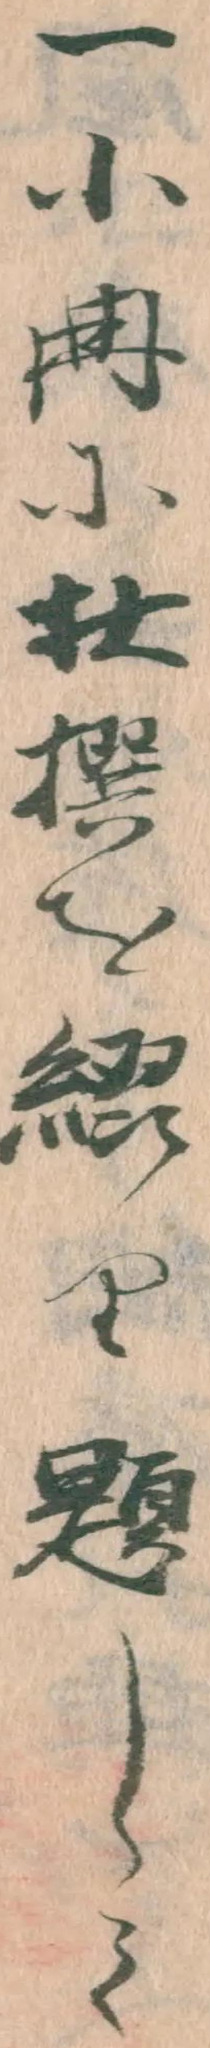一小冊に杜撰を綴り題して
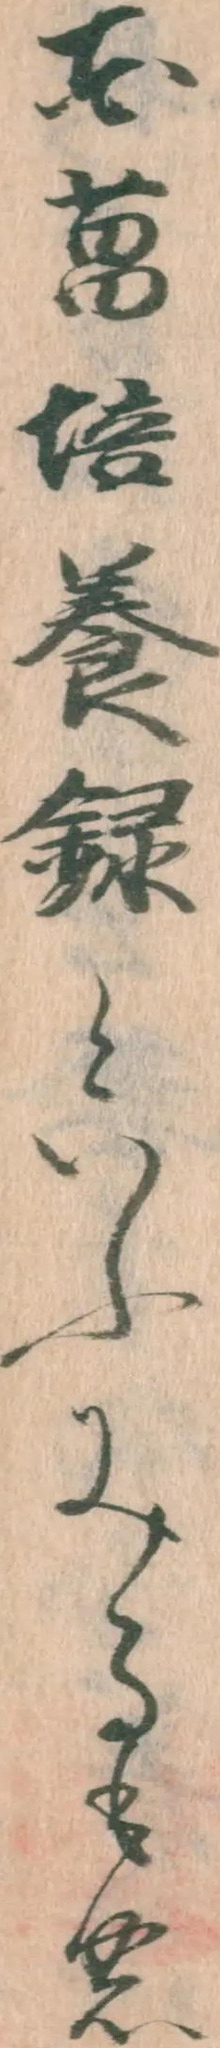花菖蒲培養録といふみるもの
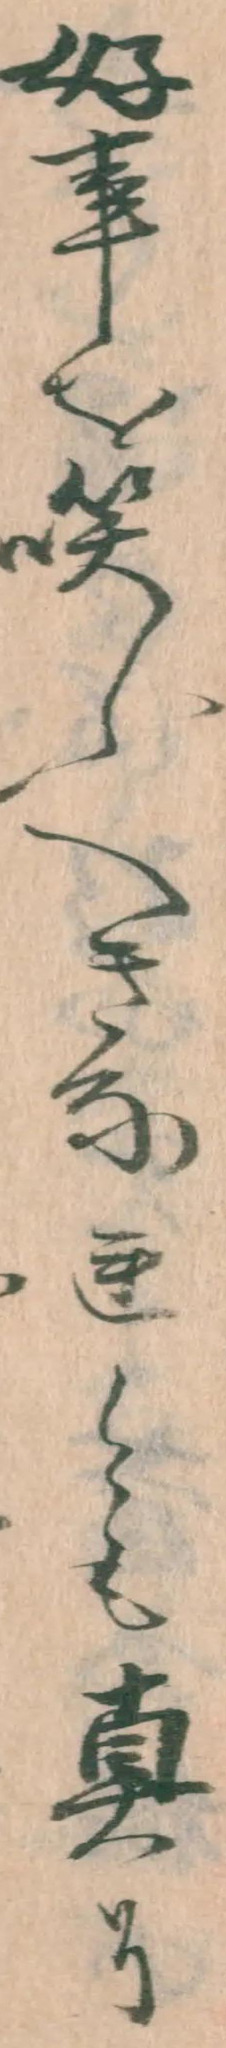好事を笑ふへきなれとも真に
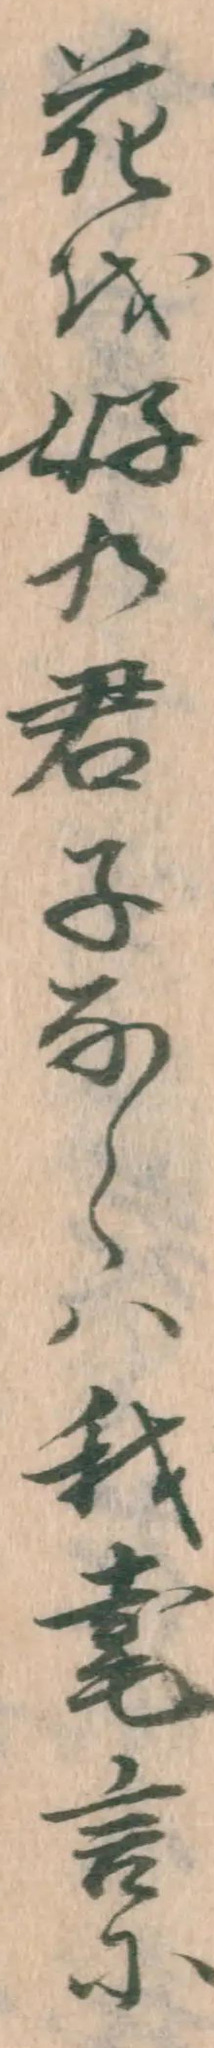花を好の君子ならは我毫言に
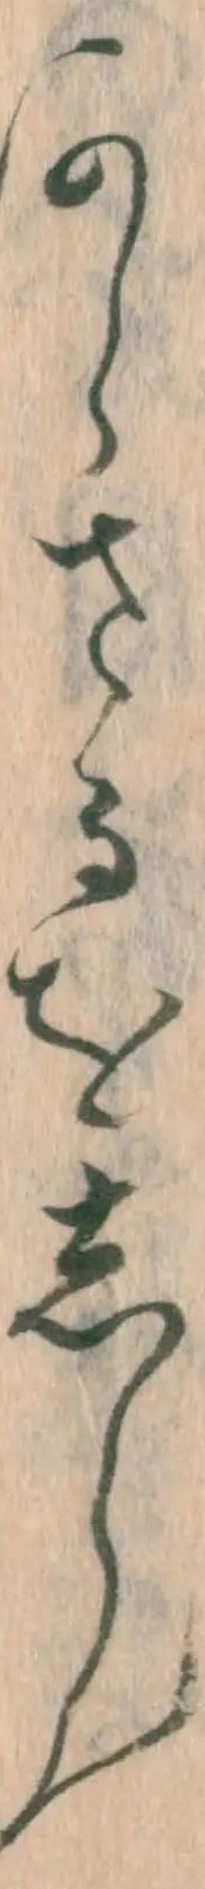あらさるをしらん
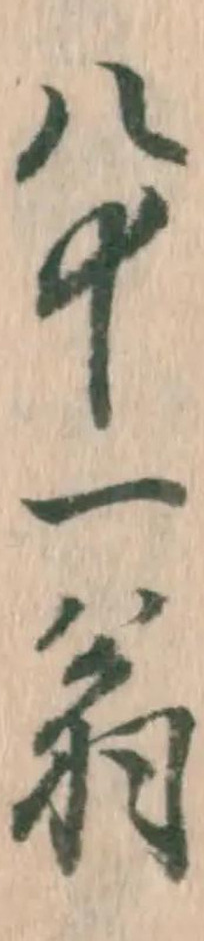八十一翁
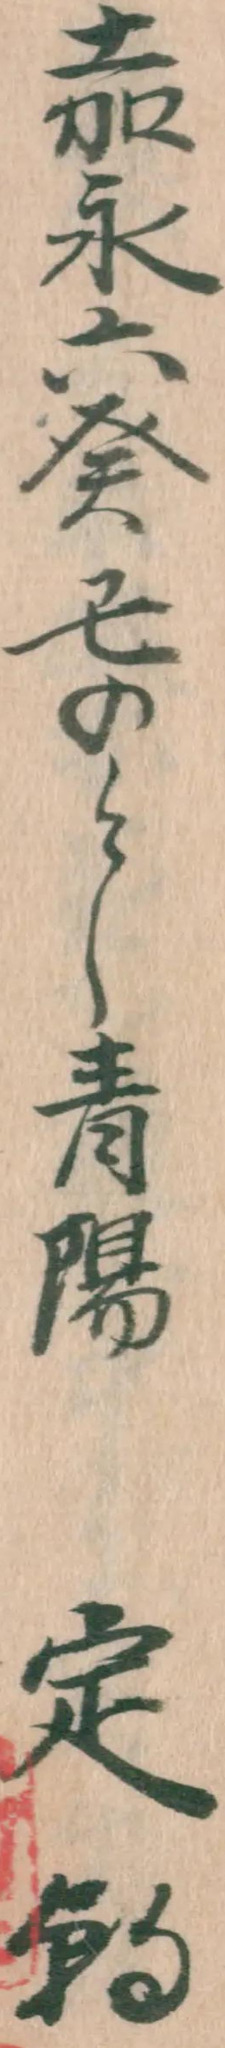嘉永六癸丑のとし青陽定朗

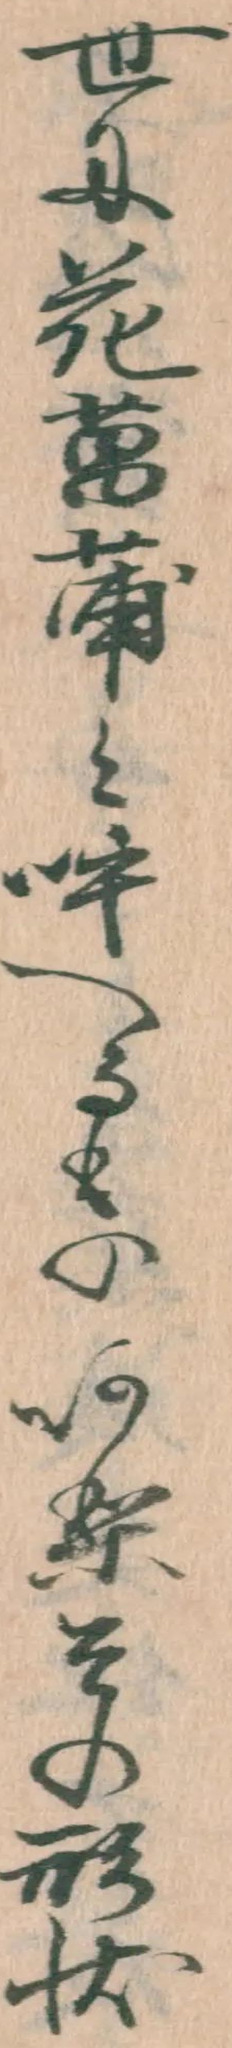世に花菖蒲と呼へるものありその形状
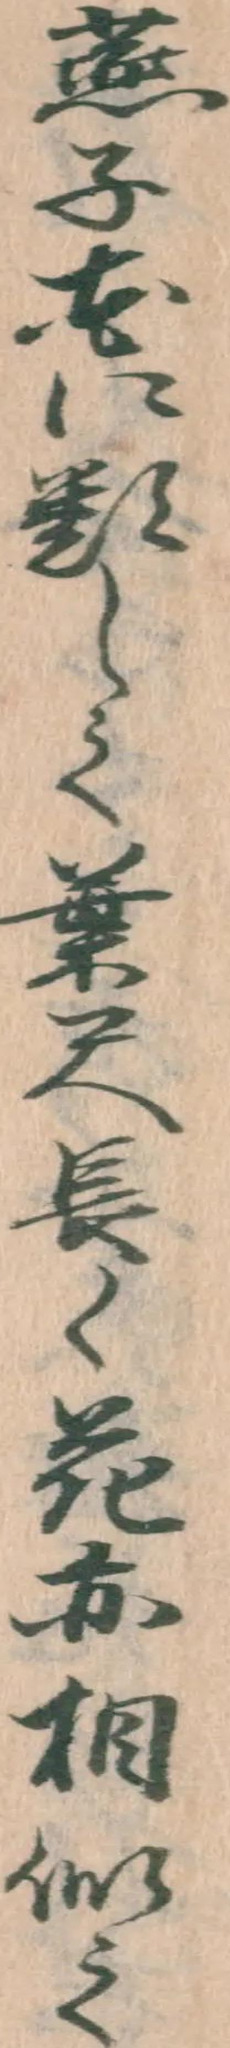燕子花に類して葉尺長く花亦相似て
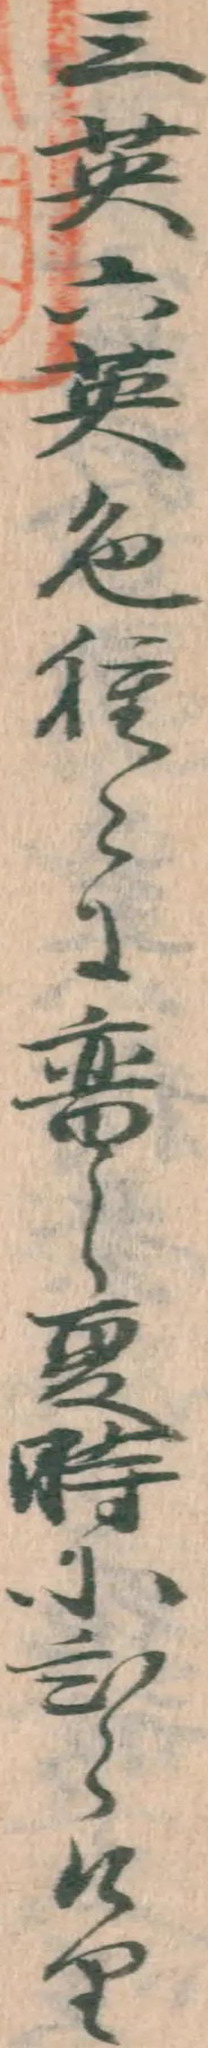三英六英色往々に変し夏時にひらけり
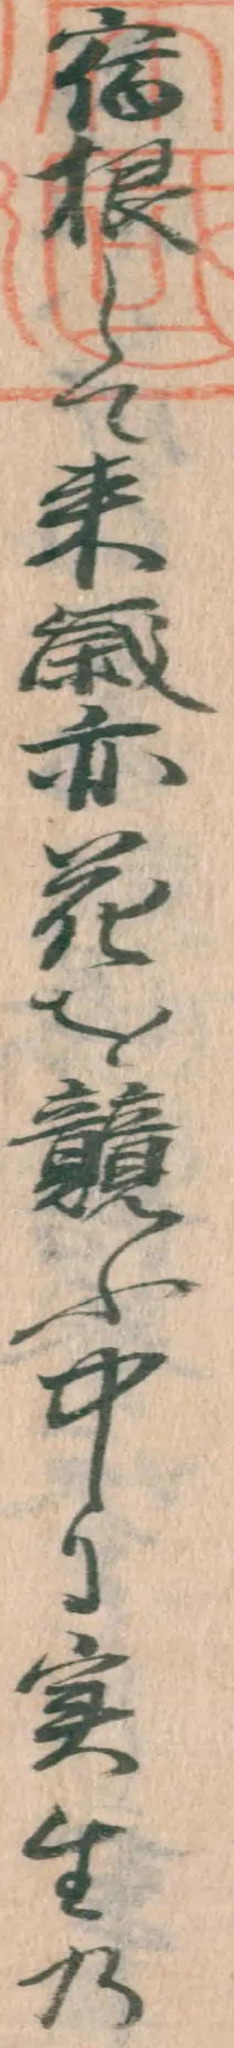宿根して来歳亦花を競ふ中に実生の
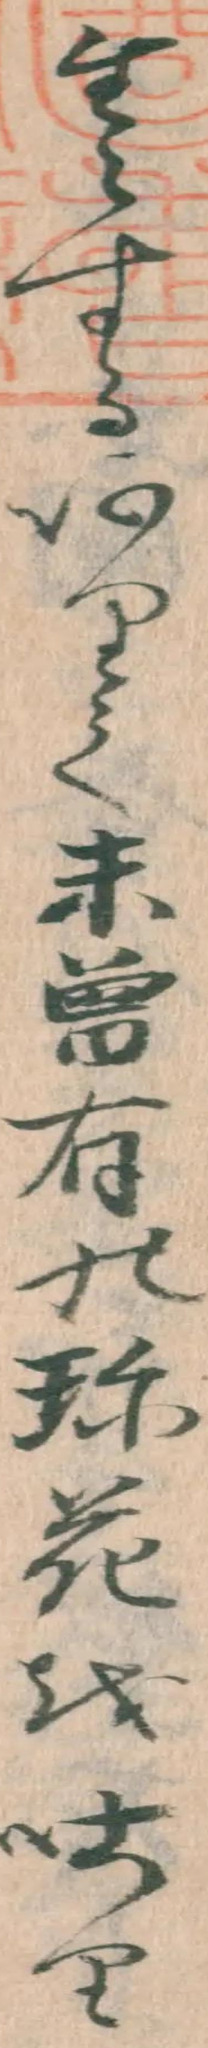生々するありて未曾有の珍花を吐り
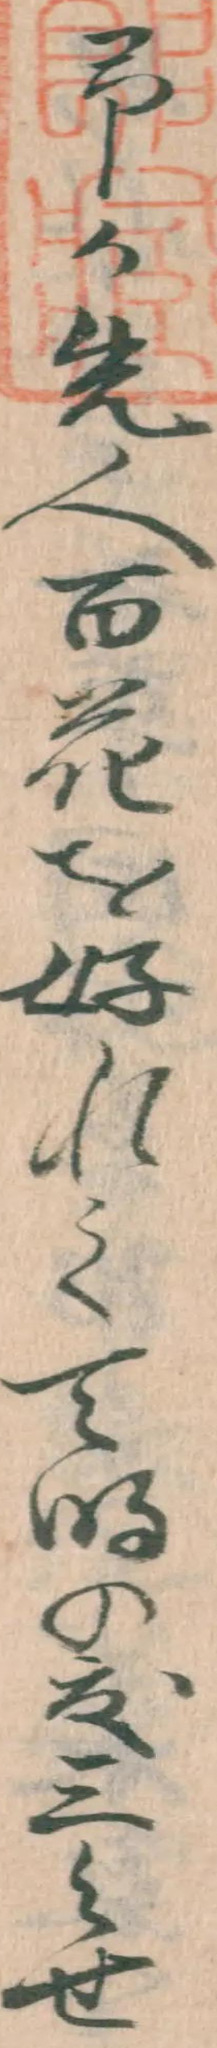予の先人百花を好れて天明の夏三とせ
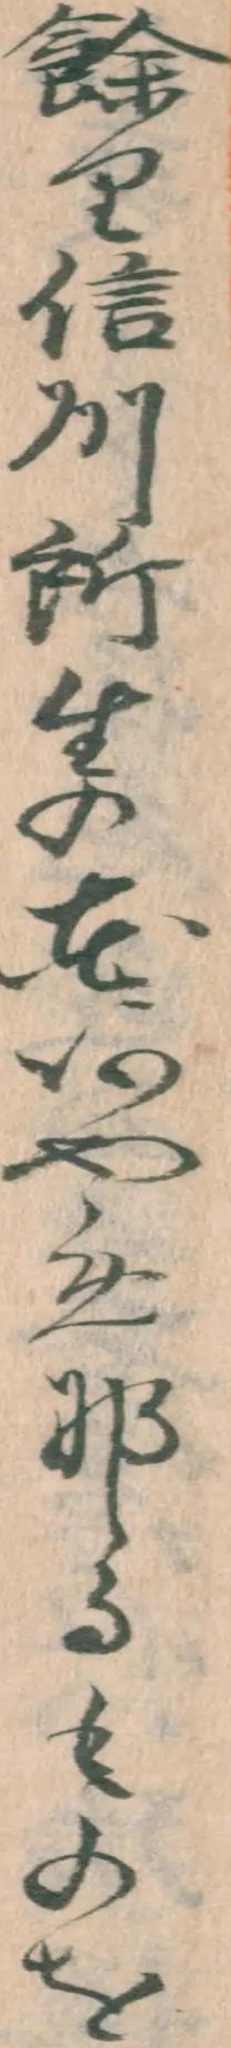余りし信州所生の花あやめなるものを
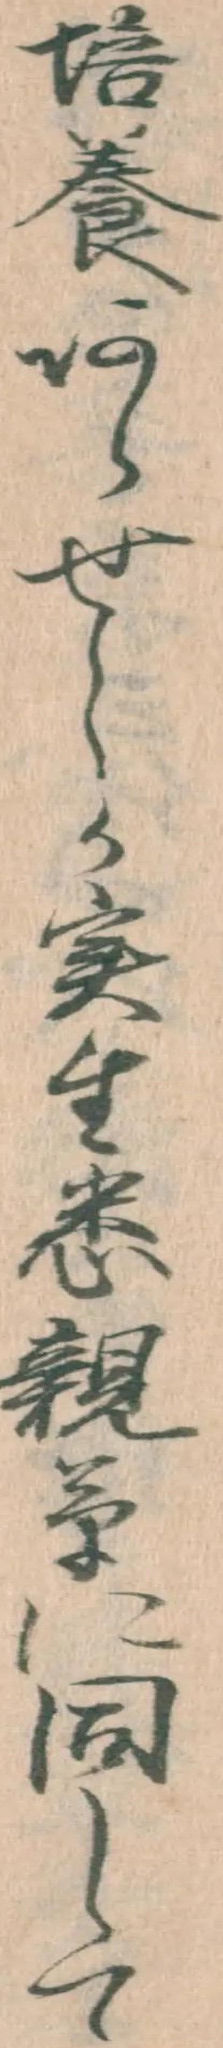培養あらせしか実生悉親草に同して
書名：花菖培養録
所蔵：国立国会図書館 National Diet Library, JAPAN
